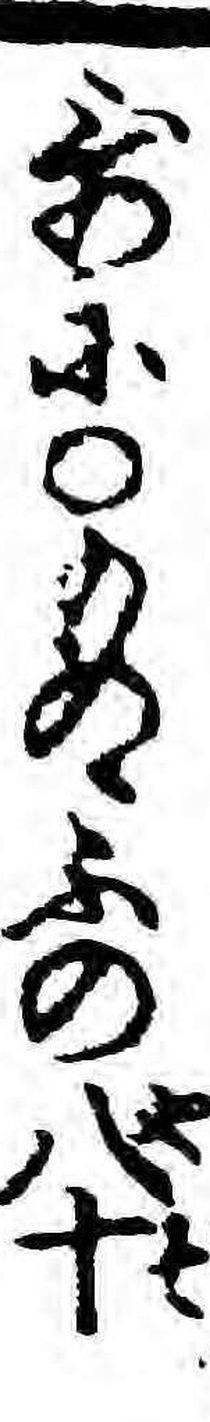哥に〇ものゝふの八十
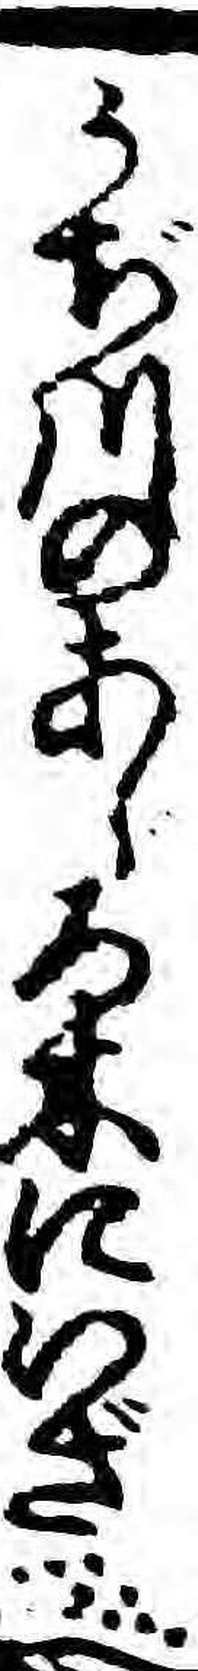うぢ川のあじろ木にいざ
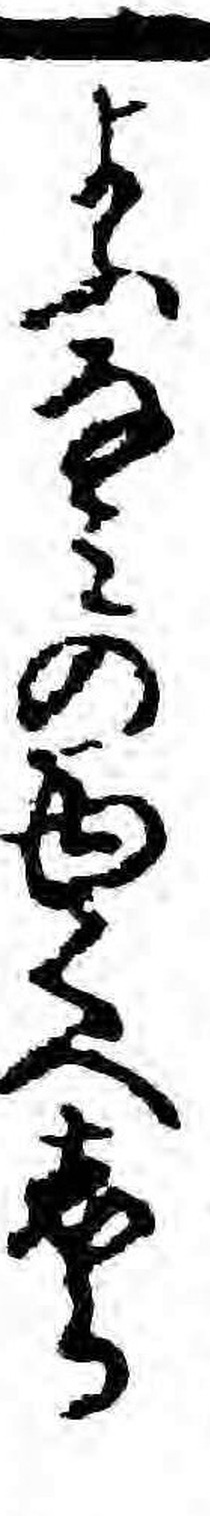よふなみのゆくへしら
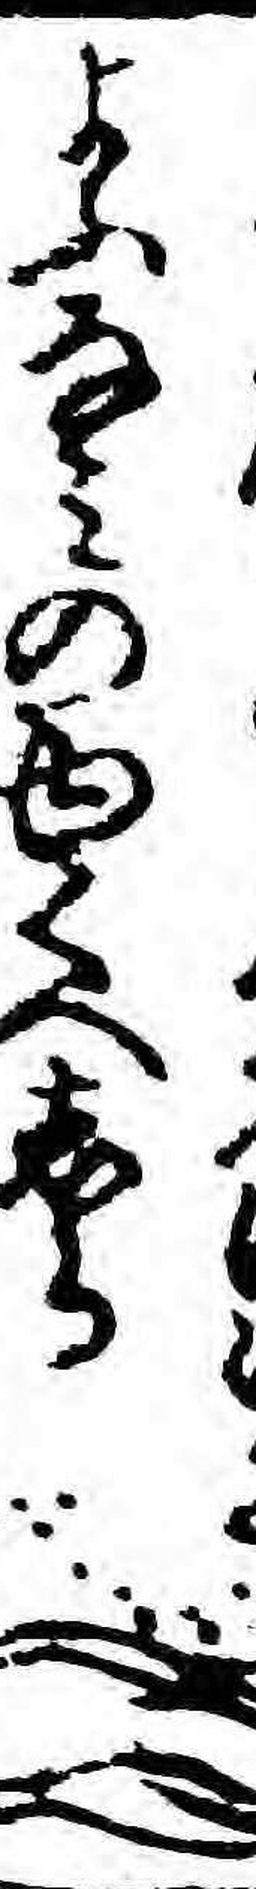よふなみのゆくへしら
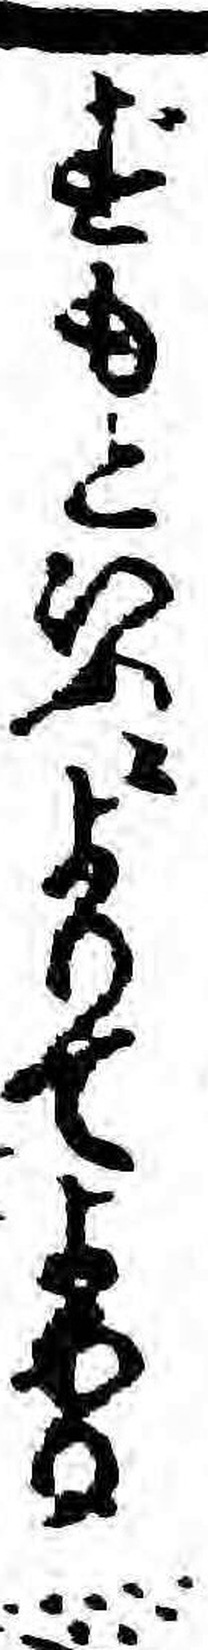ずもといふによりてよめり
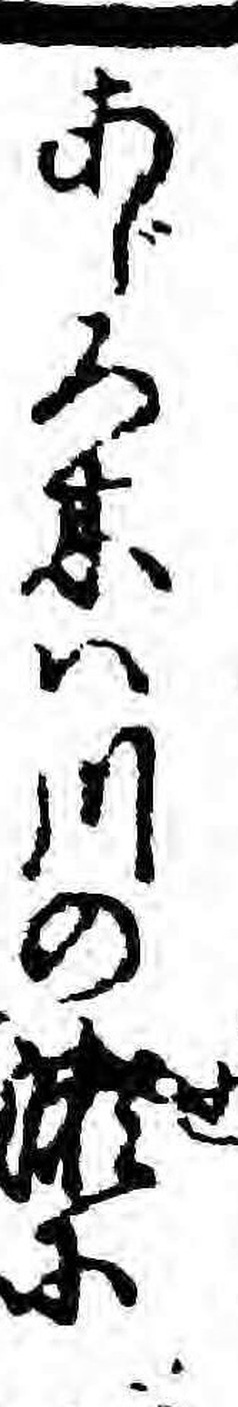あじろ木は川の瀬に
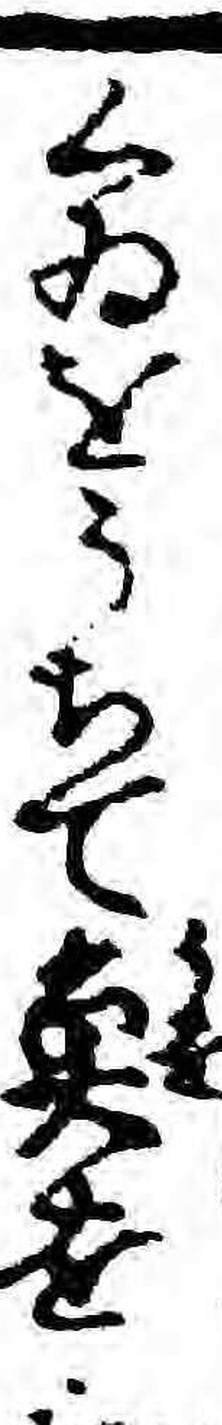くゐをうちて魚を
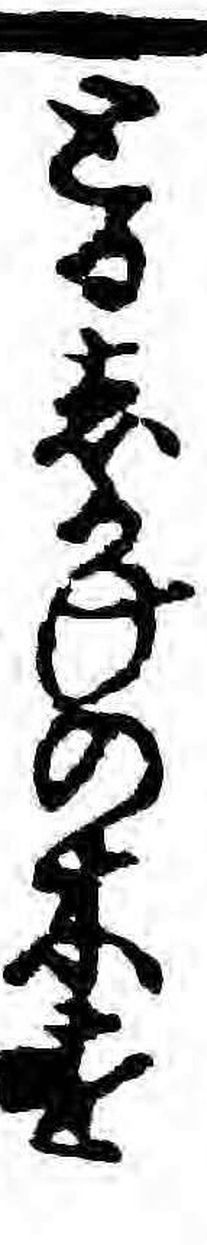とるしかけの木を
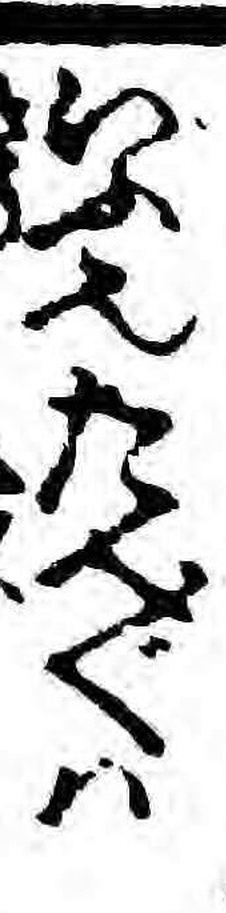いふ也たへ〴〵は
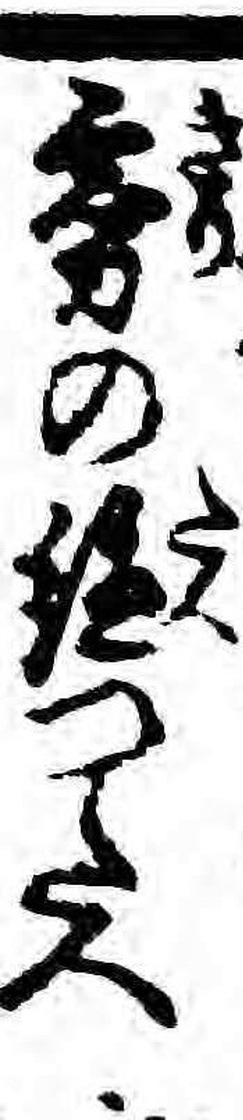霧の絶つたへ
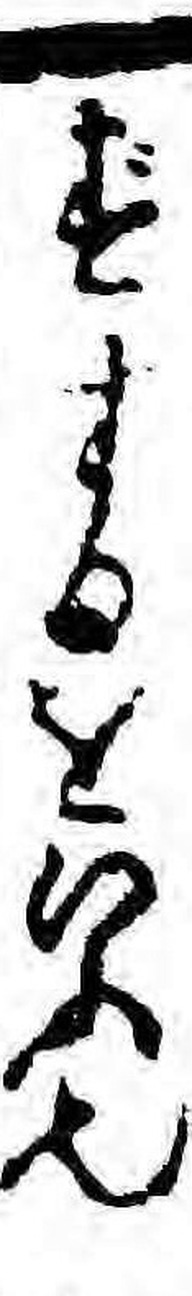ずするをいふ也
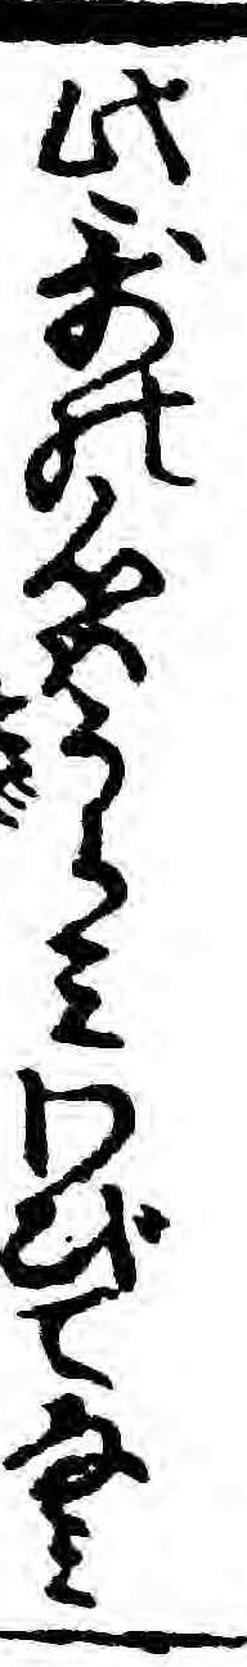此哥の心はうらみわびてなみ
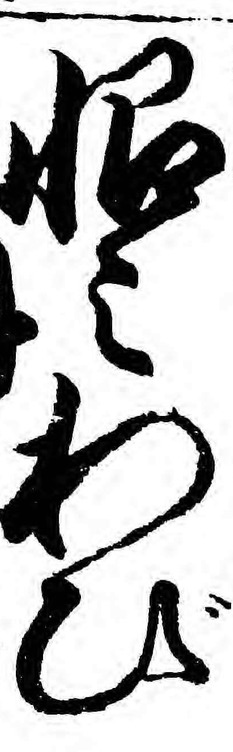恨みわび
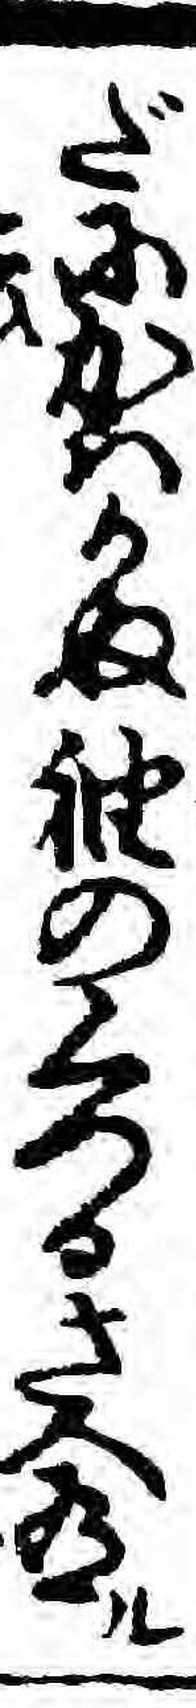だにかはかぬ袖のくつるさへ有る
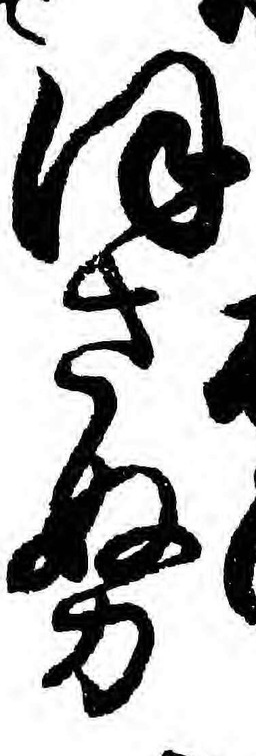ほさぬ
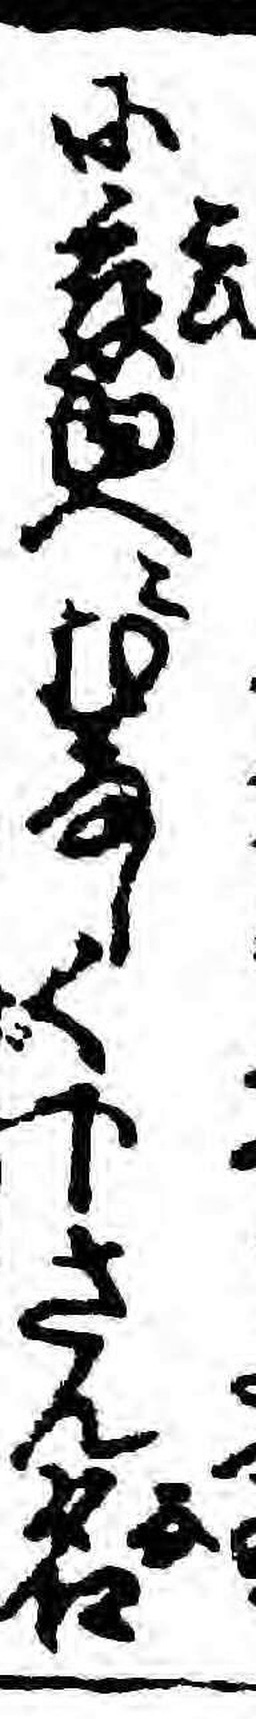に恋ゆへにむなしく下さん名
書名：頭書和歌注譯／壽賀多百人一首小倉錦
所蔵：国文学研究資料館
